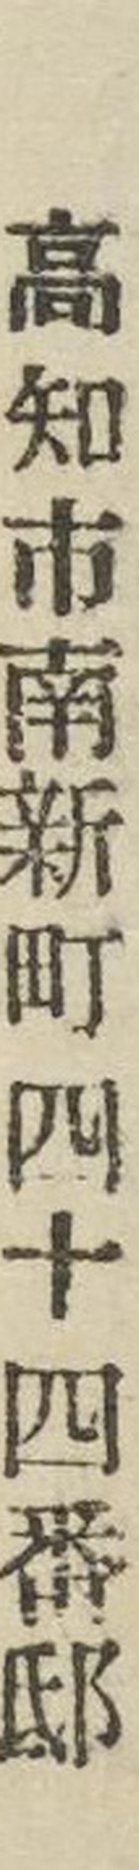高知市南新町四十四番邸
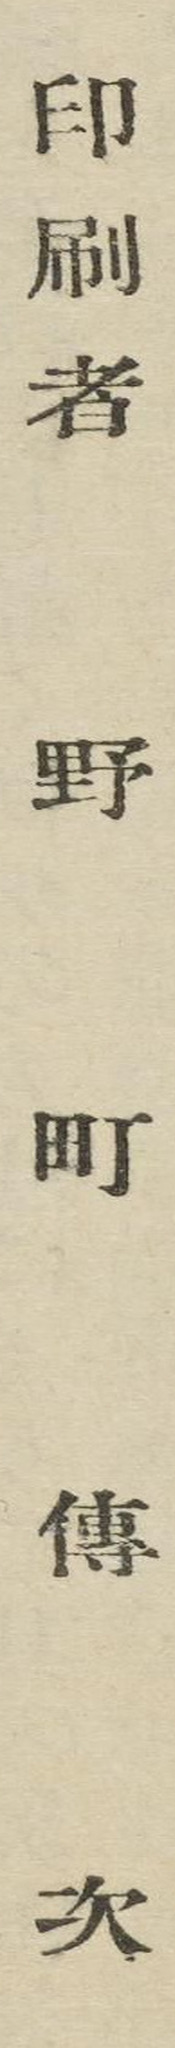印刷者野町傳次
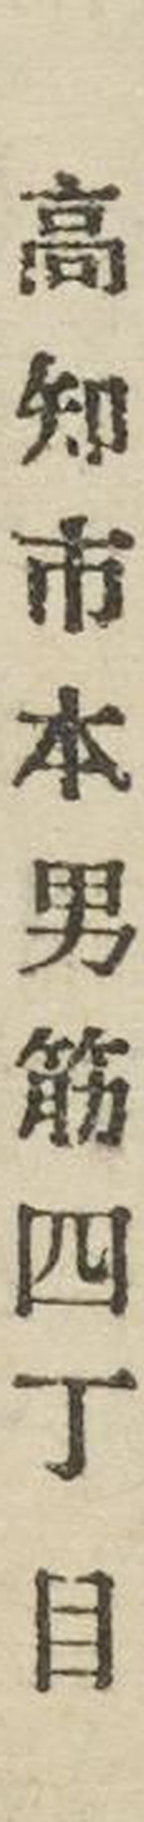高知市本男筋四丁目
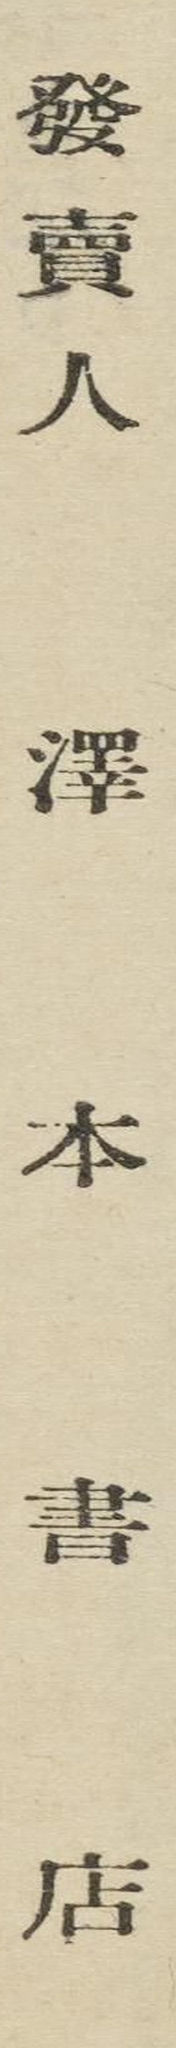発売人澤本書店
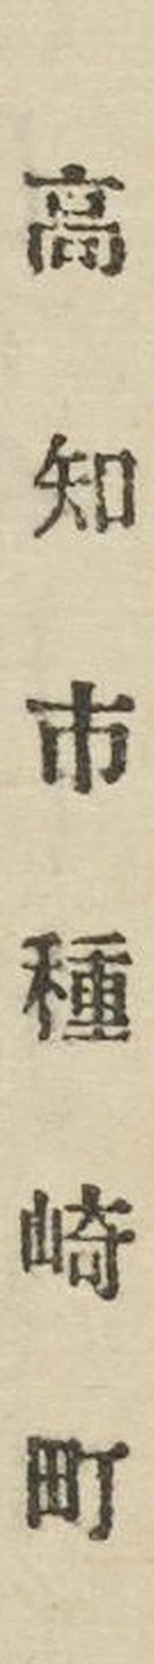高知市種崎町
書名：土佐古今ノ地震
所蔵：東京大学地震研究所図書室 Earthquake Research Institute Library, The University of Tokyo, JAPAN
